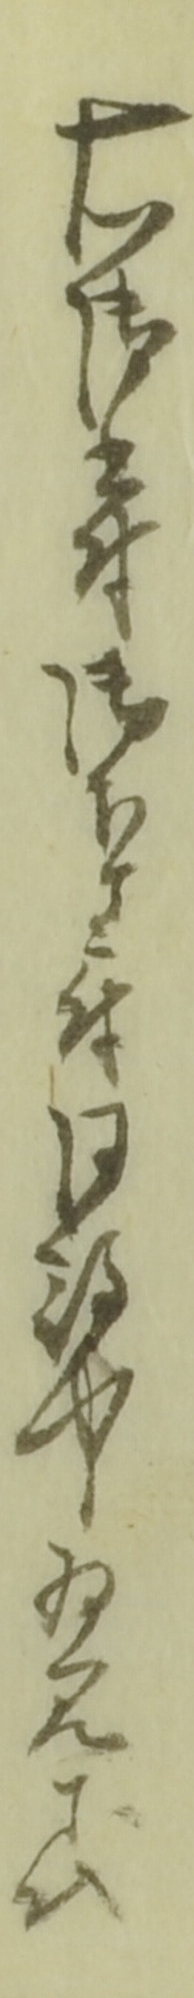右御書付御下ヶニ付同役中為見丁代
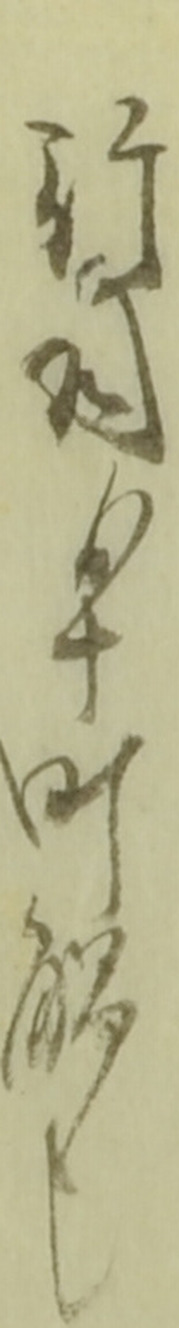行司ゟ十町触申候
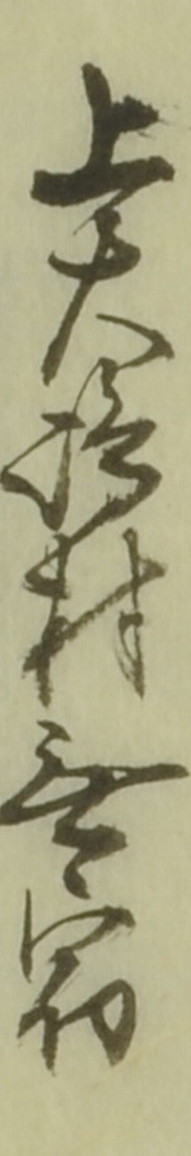上大嶋村無宿
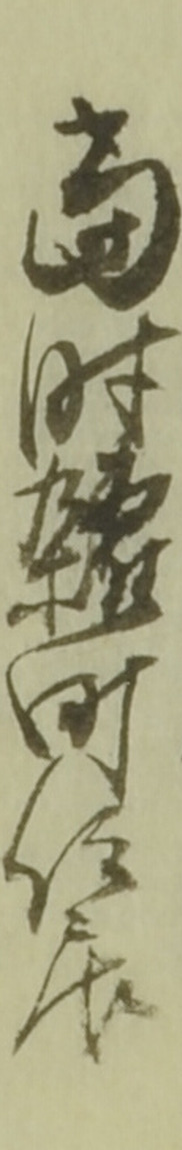当時雑町住居
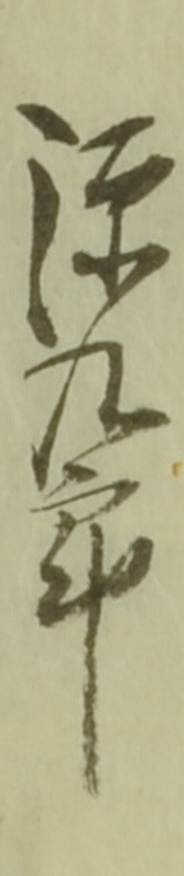源九郎
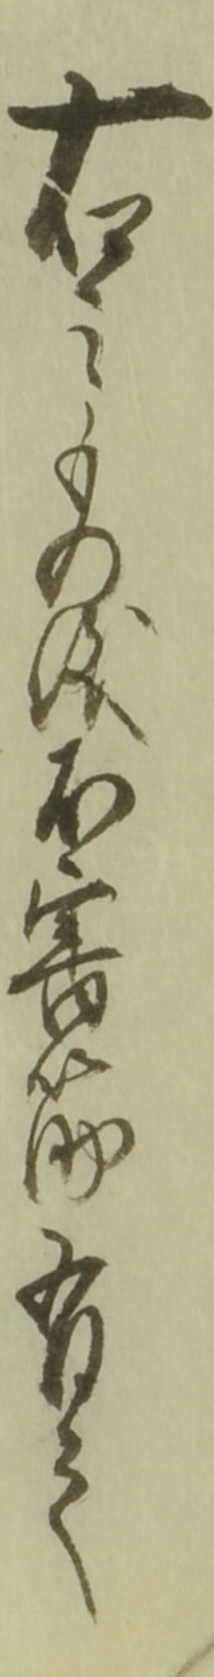右之もの儀不審筋有之
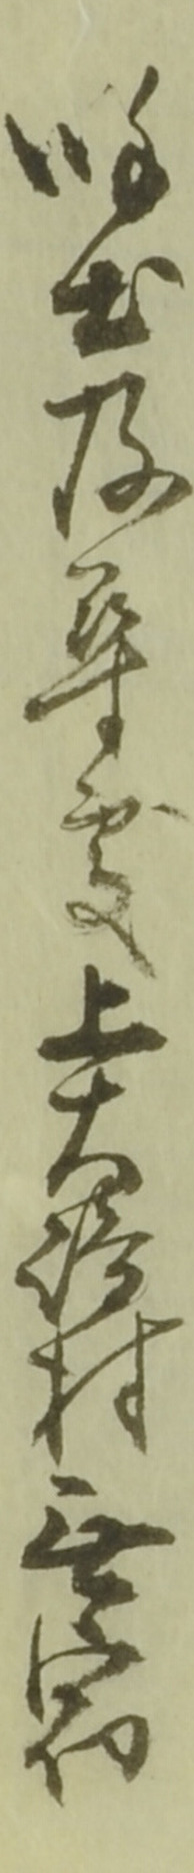呼出及尋処上大嶋村無宿
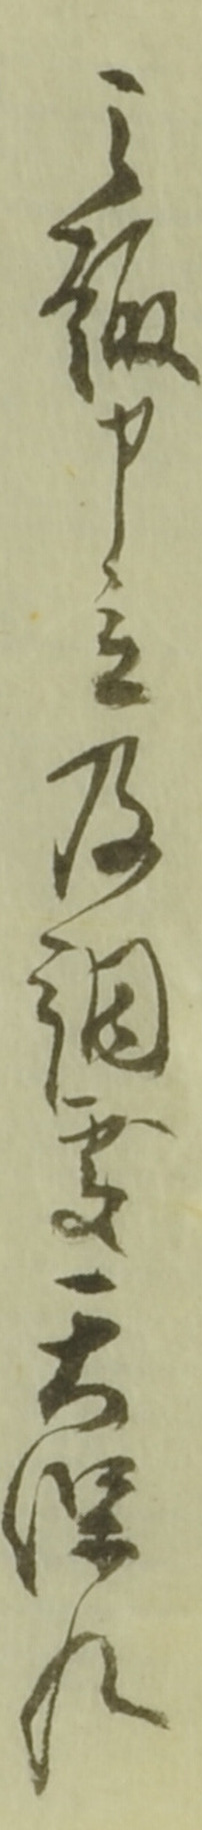之趣申立及調処天保九
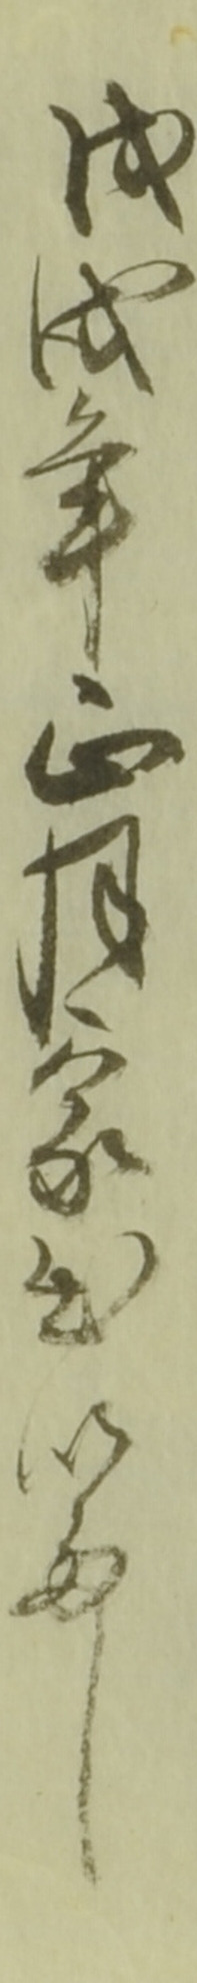戊戌年正月家出いたし
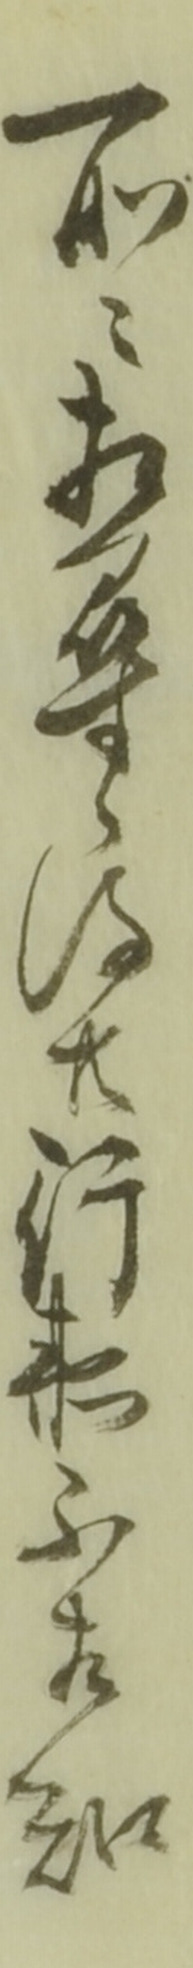所々相尋候得共行衛不相知
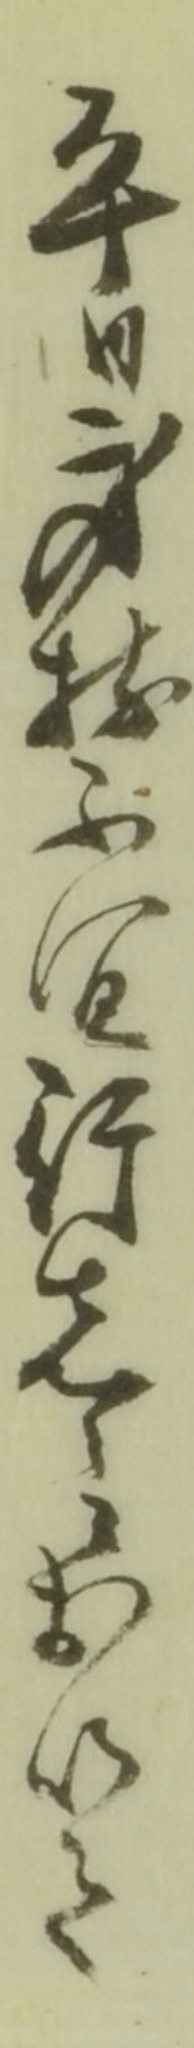平日身持不宜行先において
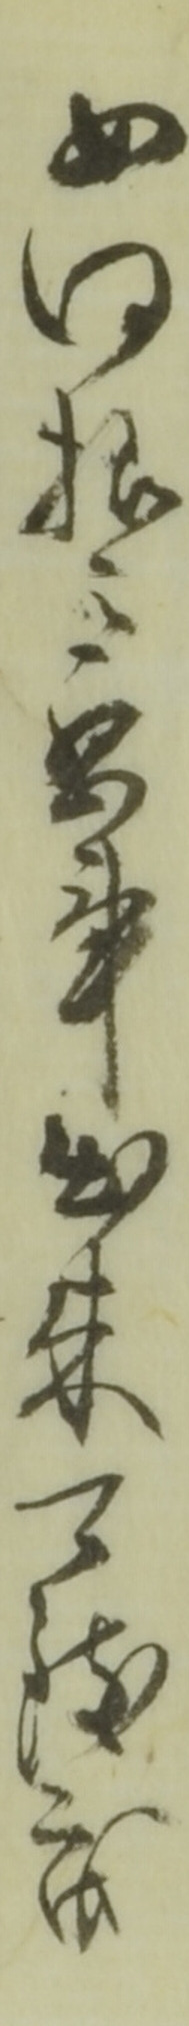如同様之悪事出来可致茂
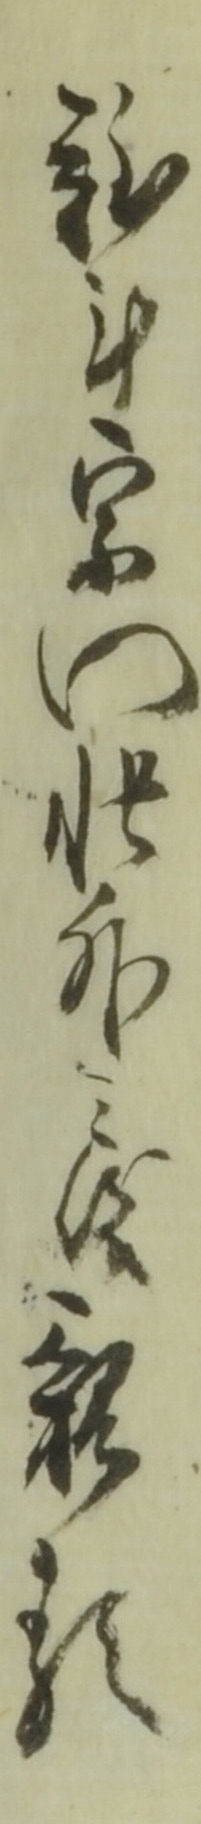難斗宗門帳外之儀親類

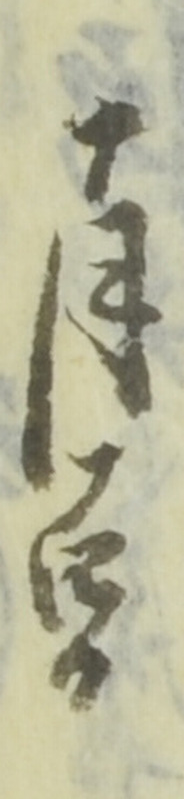十月十八日
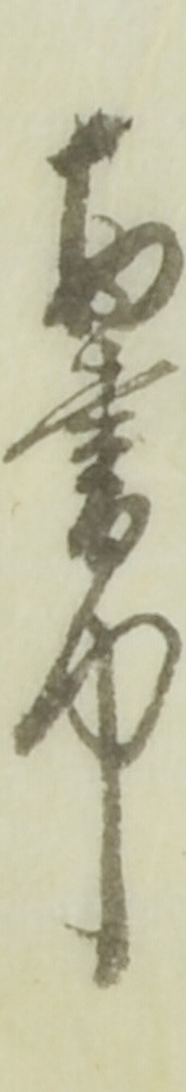物書中
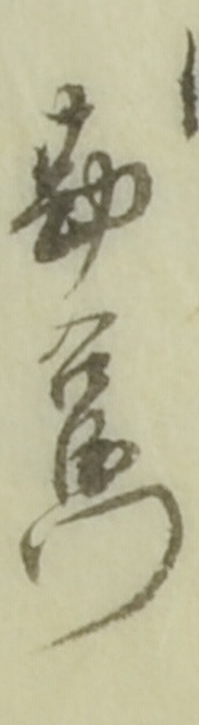勘右衛門
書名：御触書御書附控
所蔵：伊那市立高遠町図書館・合同会社AMANE
